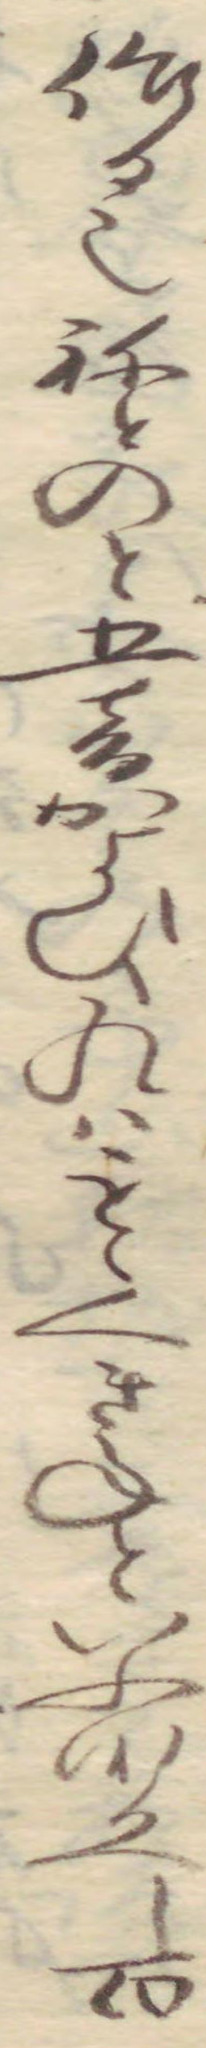作る也ねとのと五音かよひたれはもゝくきねといふなるへし百
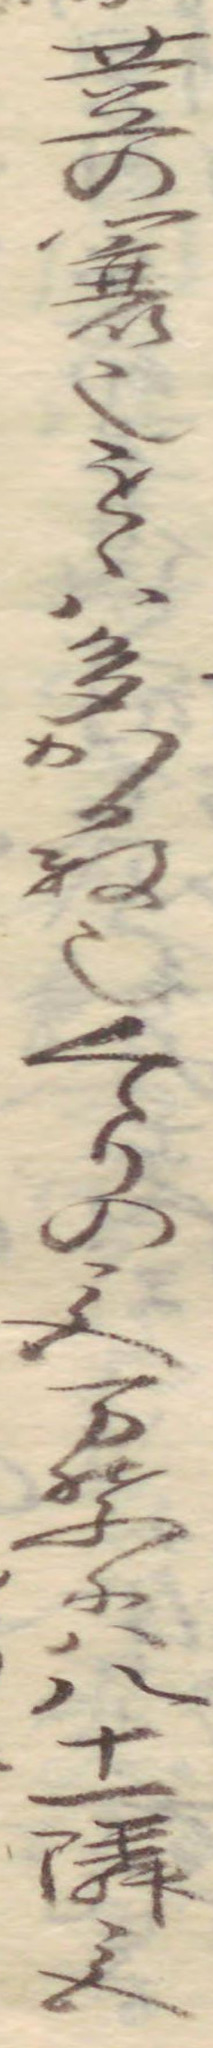茎の蓑也もゝは多かる数也くゝりの宮万葉には八十一隣宮
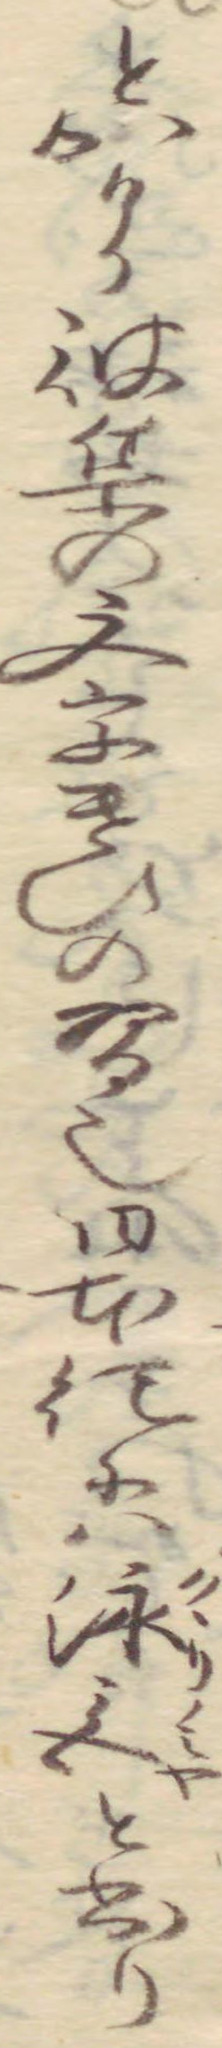とかけり彼集の文字遣ひの習也日本記には泳宮と書り
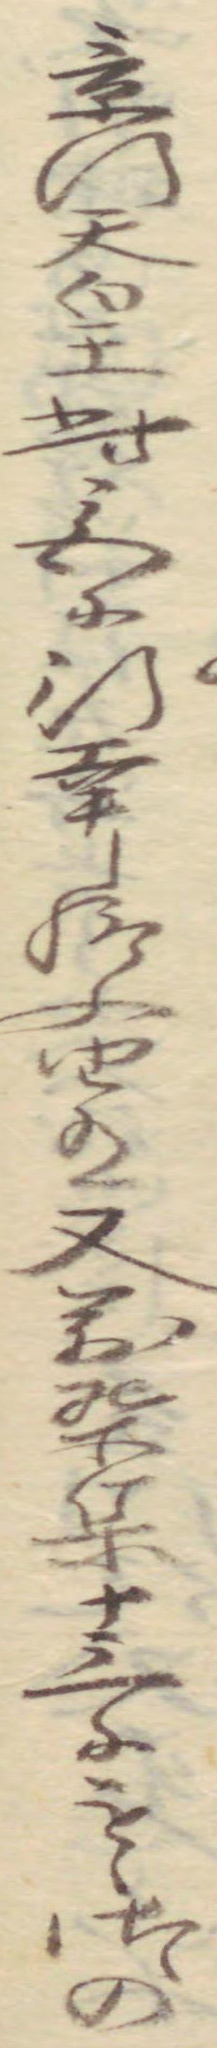景行天皇此宮に行幸し給ふ由有又万葉集十三にもゝさゝの
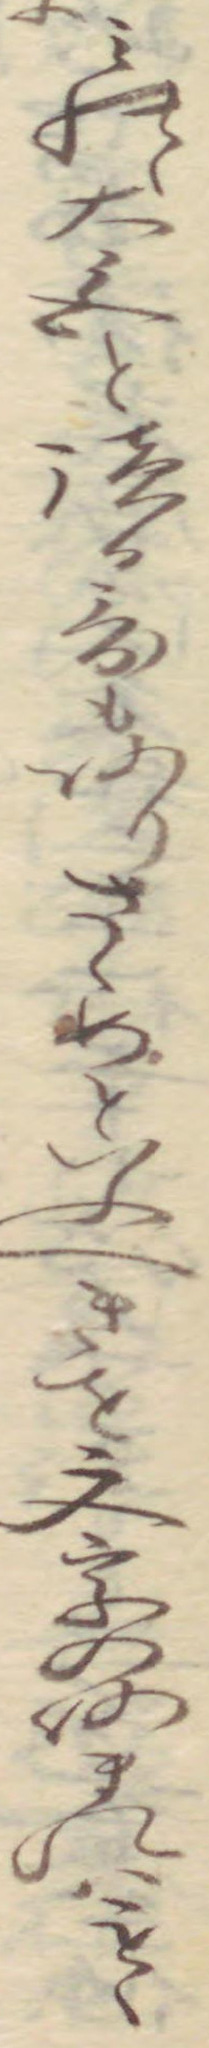みのゝ大宮と読る歌もありさゝめといふへきを文字のあまれはもゝ
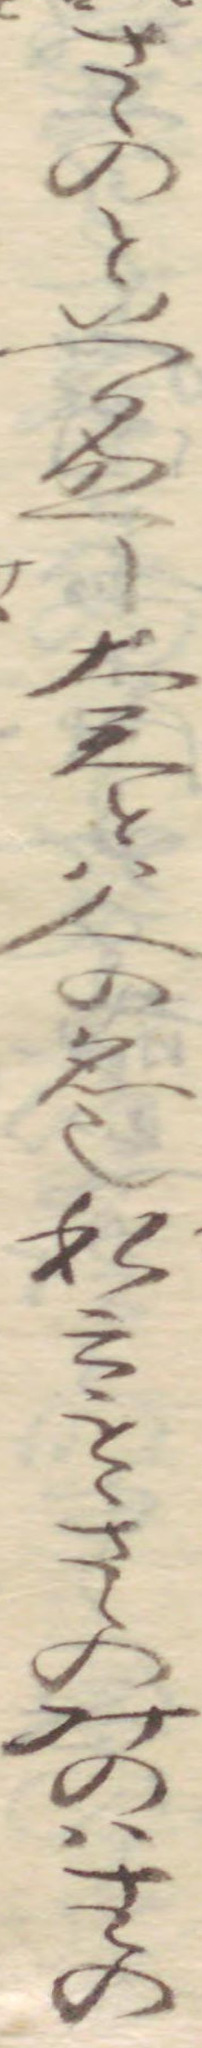さゝのといへる成へし大君とは人の名也私云もゝさゝのみはさゝの
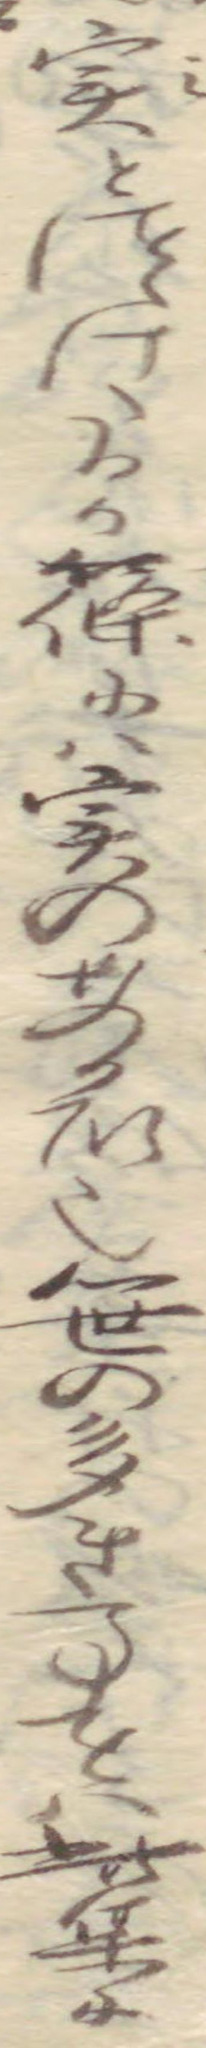実とつゝけたるか篠には実のなる故也笹の多き事をは此集に
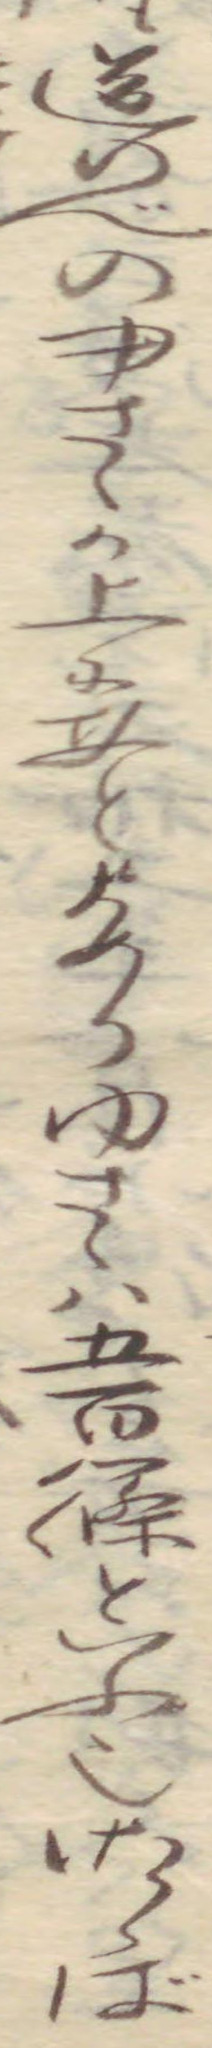道のべのゆさゝか上になとよめるゆさゝは五百篠といふ也さらば
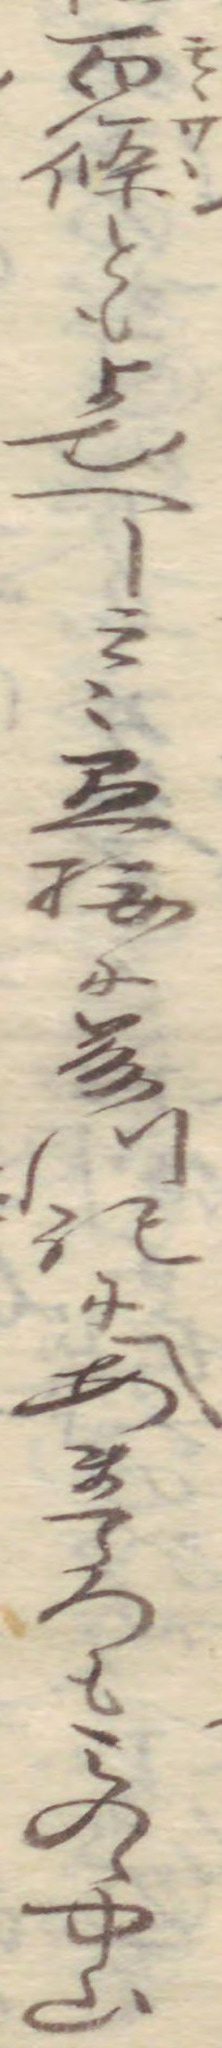百篠ともよむへし云〻愚按に藤川記に〽あまころもみのゝ中山
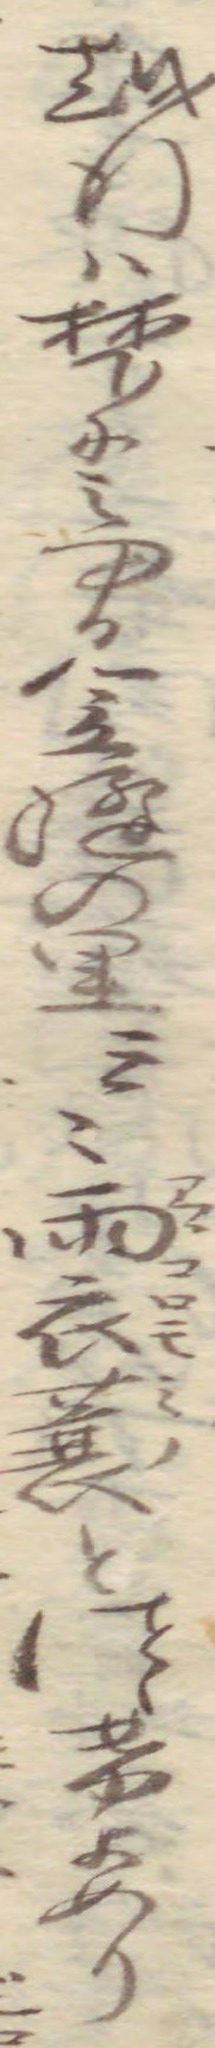越行は梺にみゆる笠縫の里云〻雨衣蓑とつゝけよめり
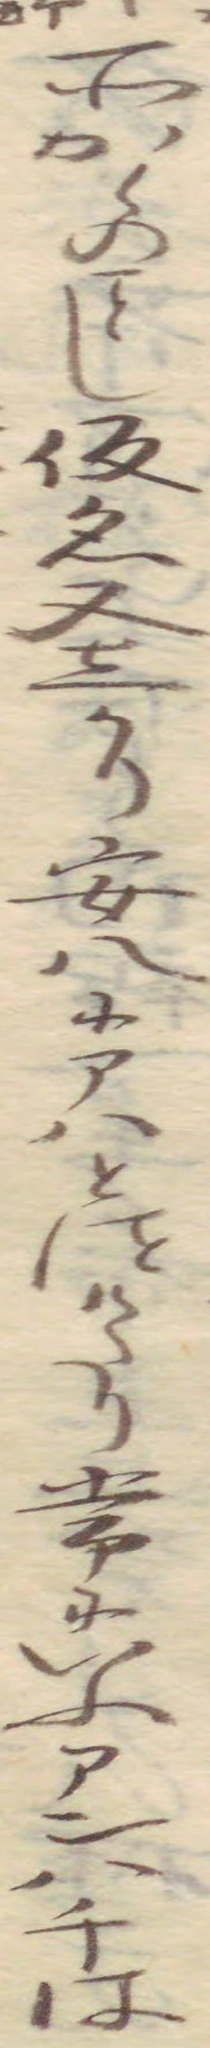所かくのことし仮名又しかり安八にアハとつけたり常にいふアンハチは
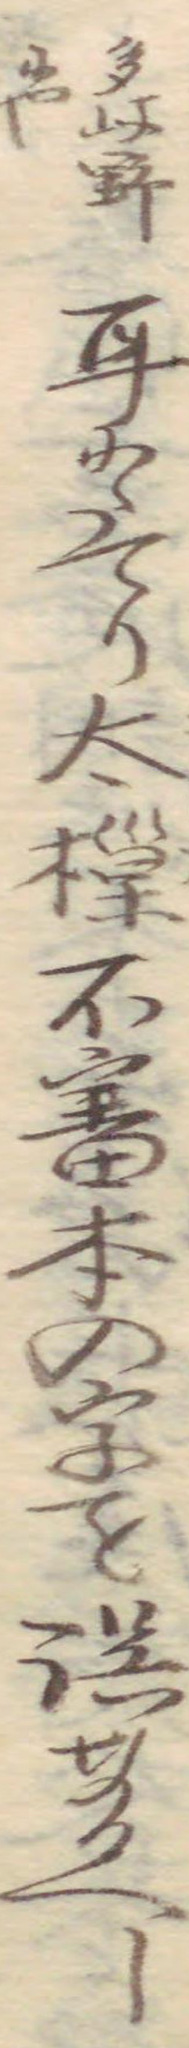耳にたてり太樔不審本の字を誤なるへし

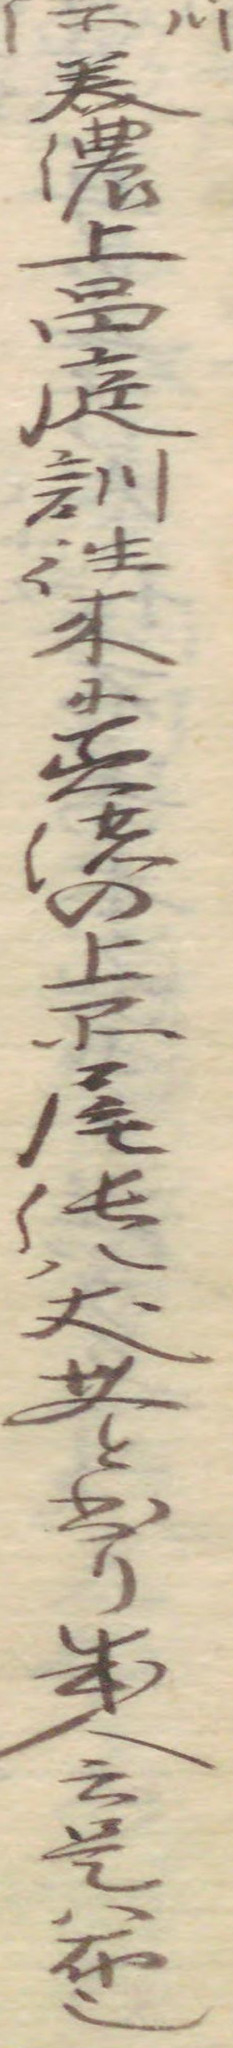美濃上品庭訓往来に美濃の上品尾張八丈なと書り或人云是は布也
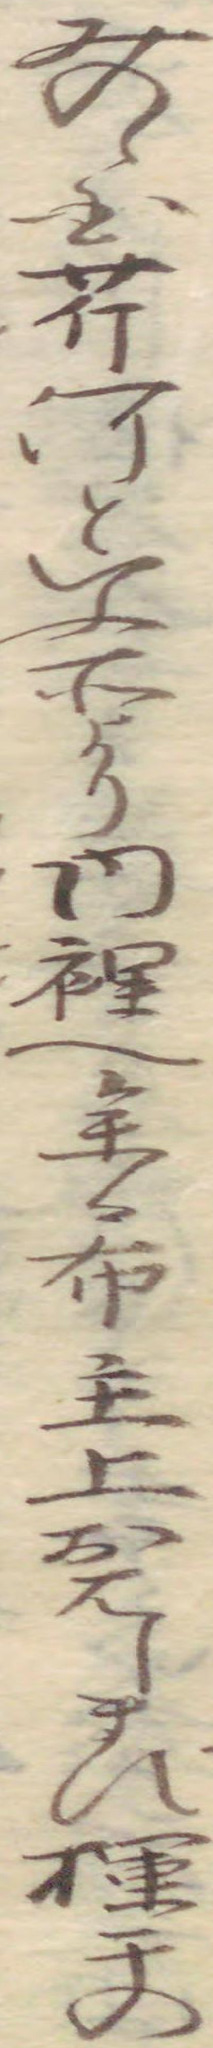みのゝ国芥河といふ所より内裡へ参る布主上おはします欄干の
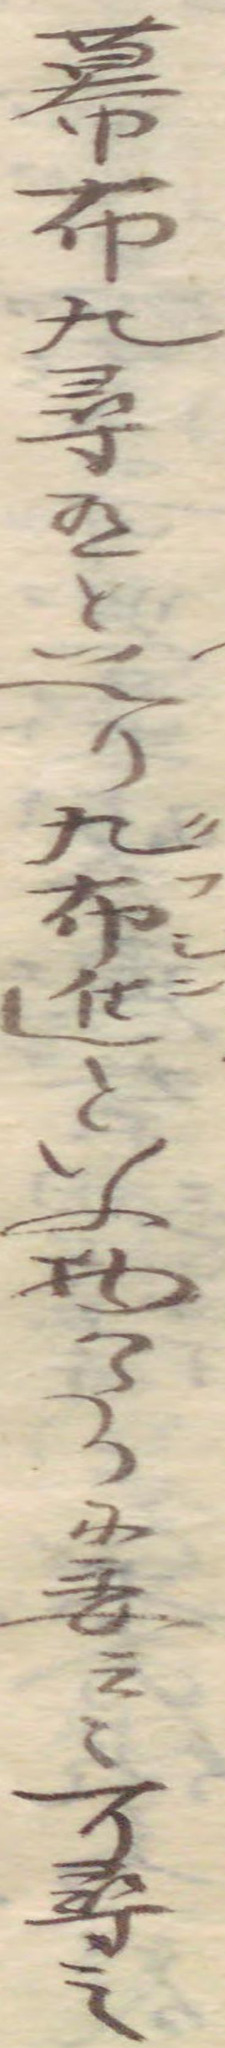幕布九尋有といへり九布進といふ物かたりに委云〻可尋之
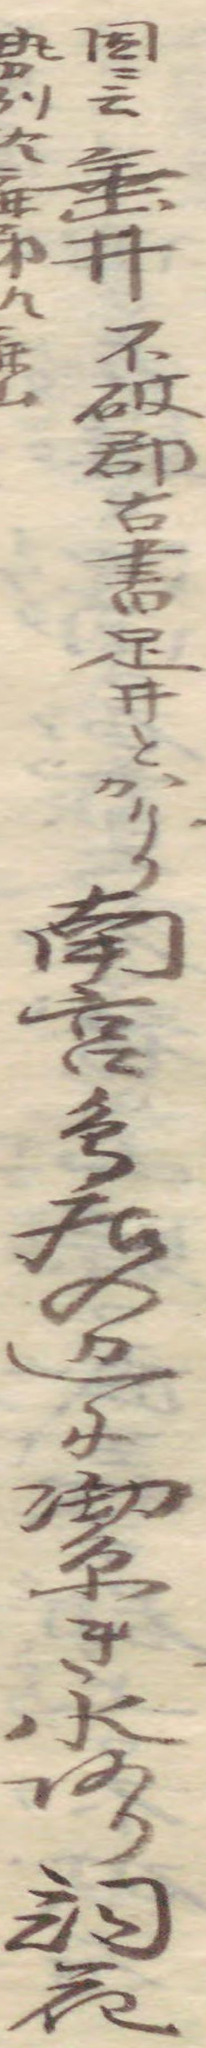垂井不破郡古書足井とかけり南宮鳥居の辺に潔き水あり詞花
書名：鶯宿雑記. 巻263-264
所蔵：国立国会図書館 National Diet Library, JAPAN
